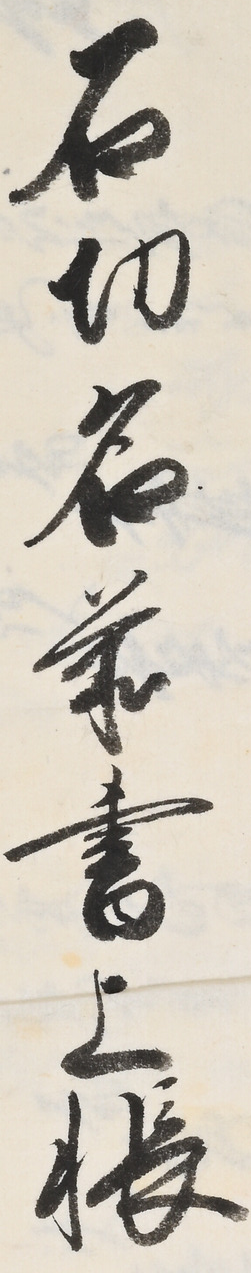石切名前書上帳
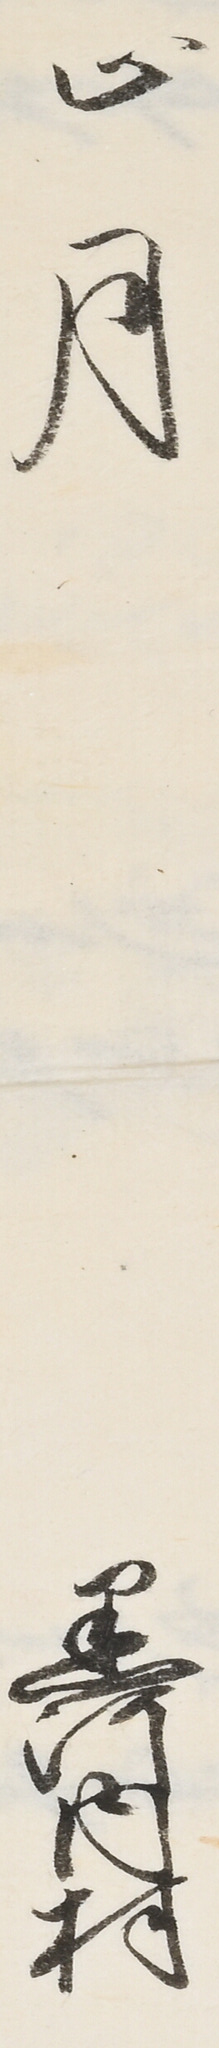正月黒河内村

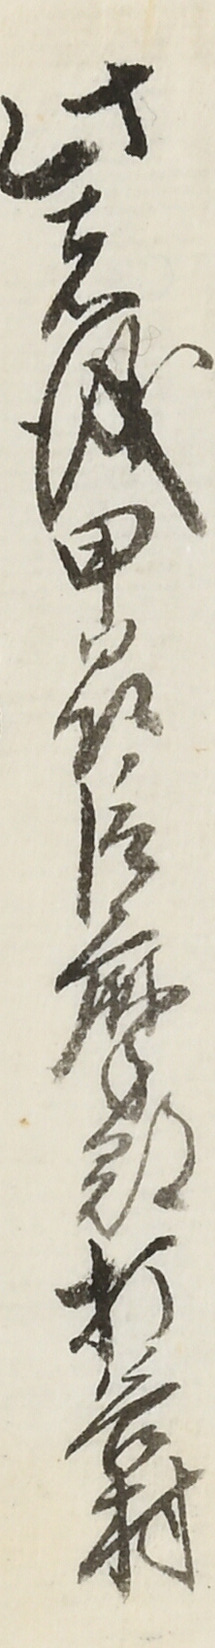此者儀甲州巨摩郡打谷村
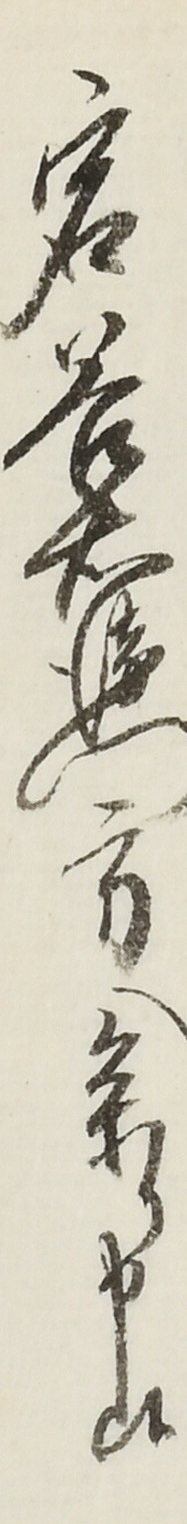宿善右衛門方へ参り申候

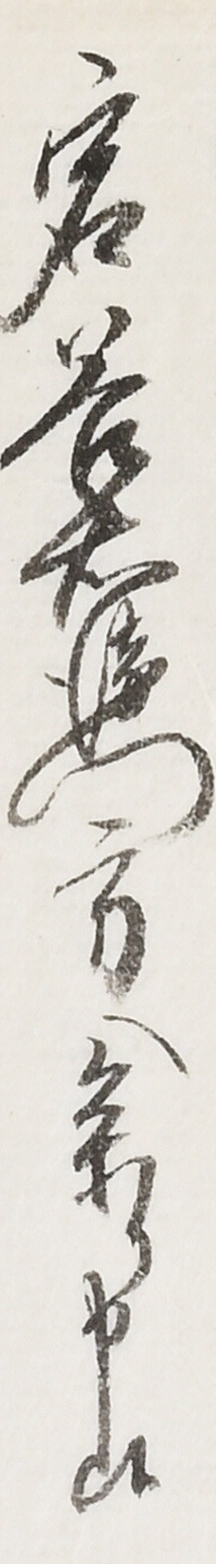宿酒造右衛門方江参り申候
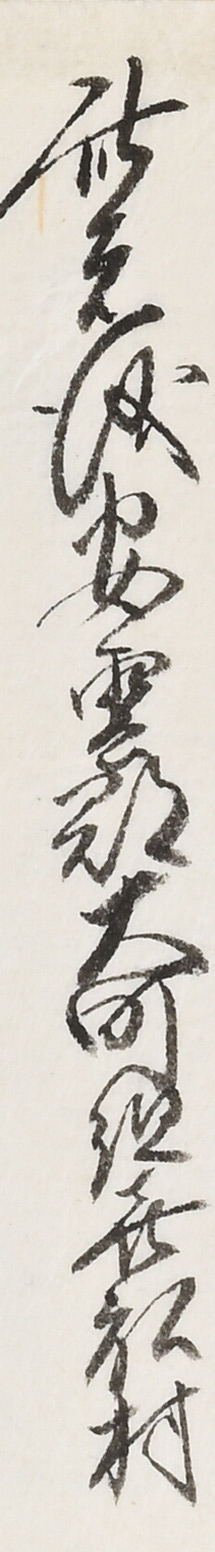此者儀安曇郡大町組喜船村
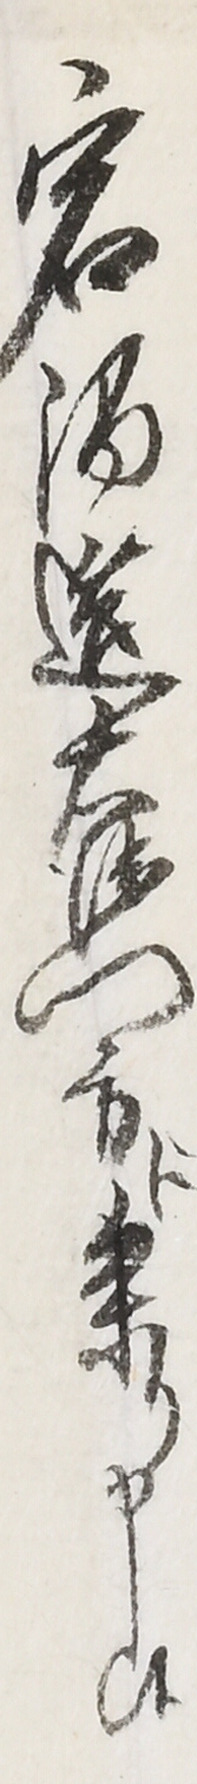宿酒造右衛門方江参り申候
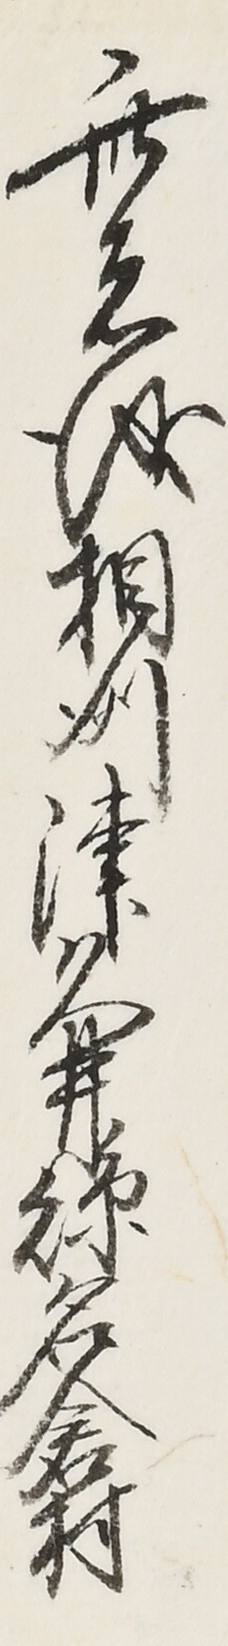此者儀相州津久井県名倉村
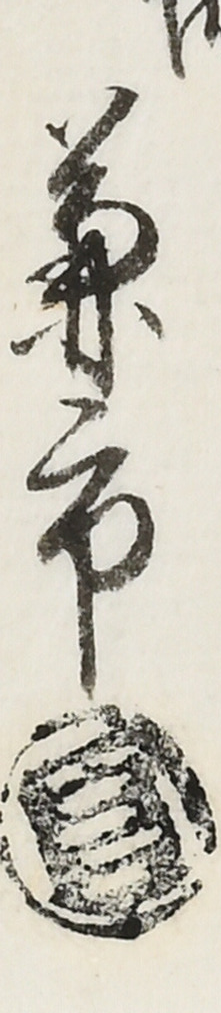兼市㊞

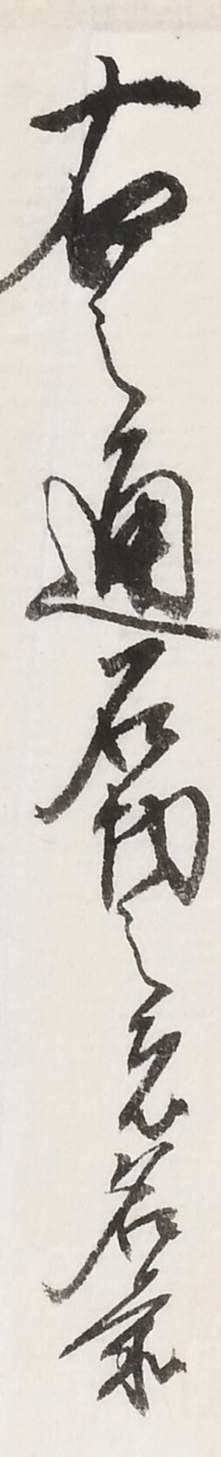右之通石切之者名前
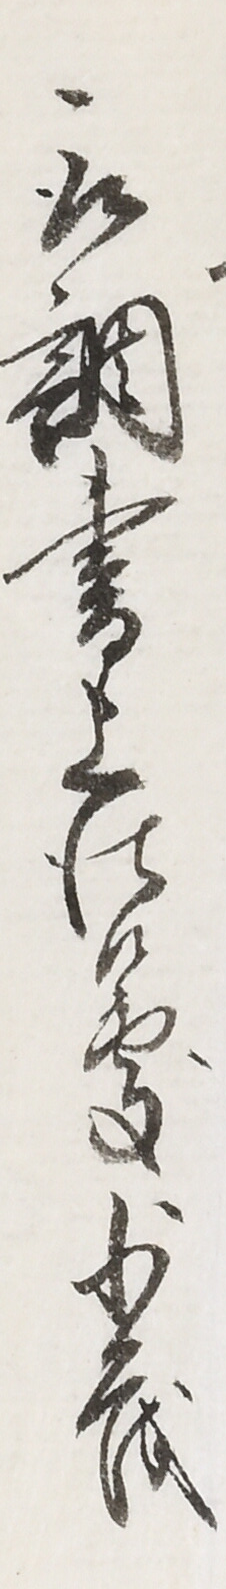取調書上仕候処少も
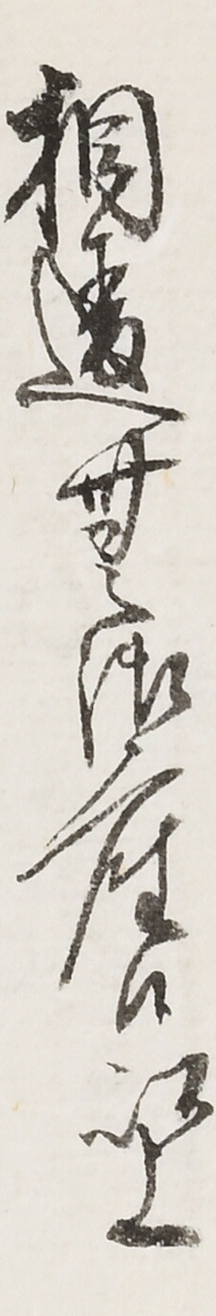相違無御座候以上
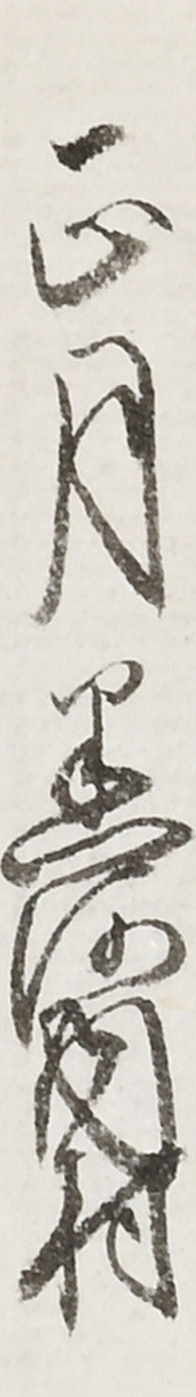正月黒河内村
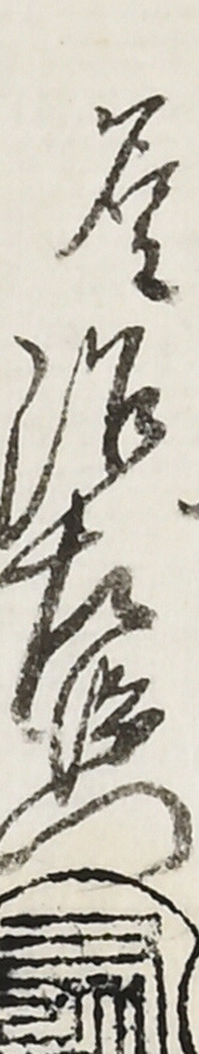名主治左衛門㊞
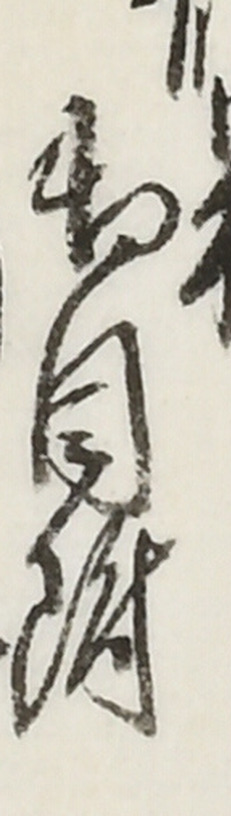御目附
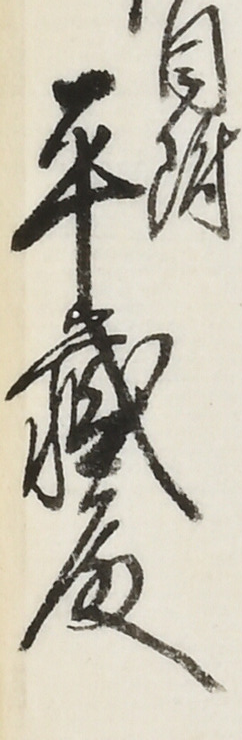平蔵殿
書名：文久二壬戌年正月石切名前書上帳
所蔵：伊那市立高遠町図書館・合同会社AMANE
